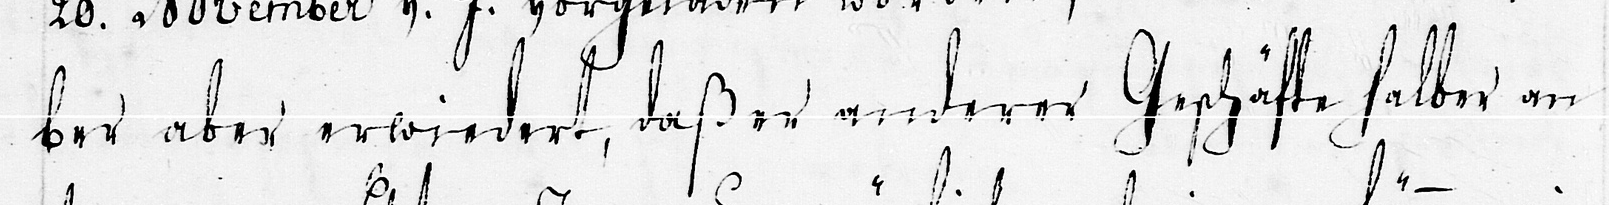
ber aber erwiedert, daß er anderer Geschäfte halber an
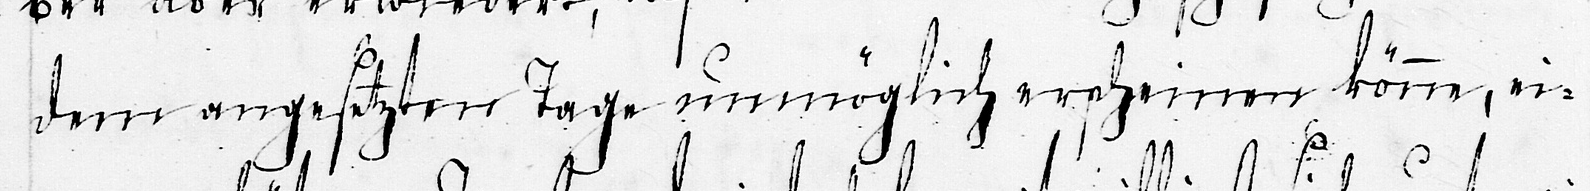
dem angesetzten Tage unmöglich erscheinen könne, ei¬
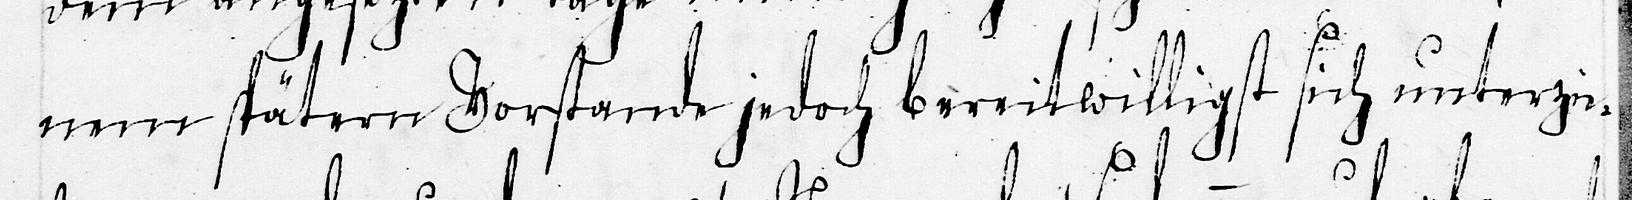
nem spätern Vorstande jedoch bereitwilligst sich unterzi¬
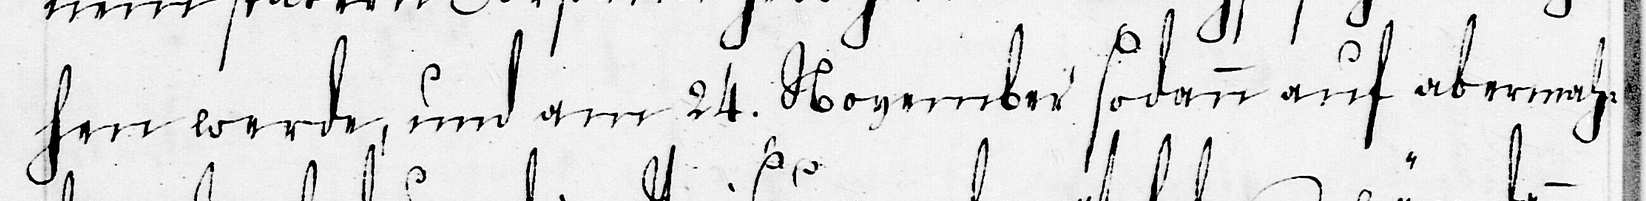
ehen werde, und am 24. November sodann auf abermah¬
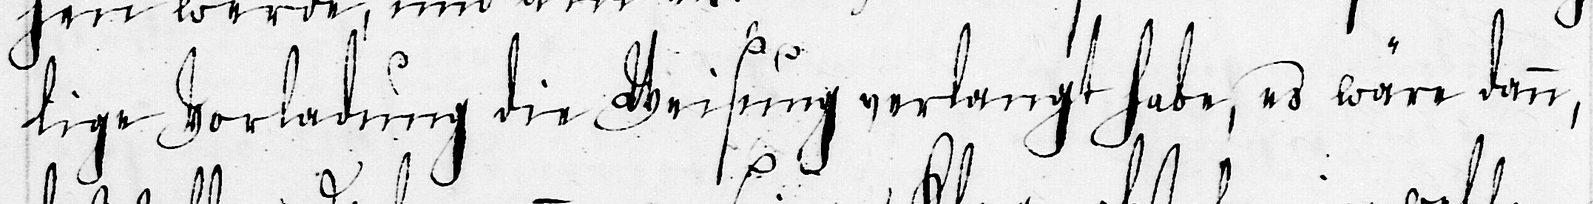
lige Vorladung die Weisung verlangt habe, es wäre dann,
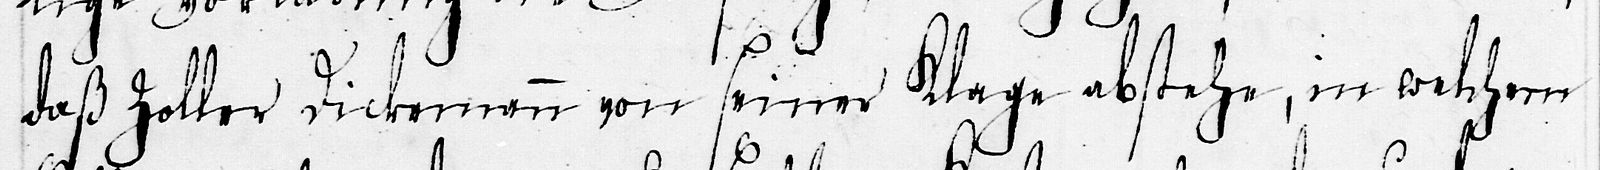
daß Zoller Dickemann von seiner Klage abstehe, in welchem
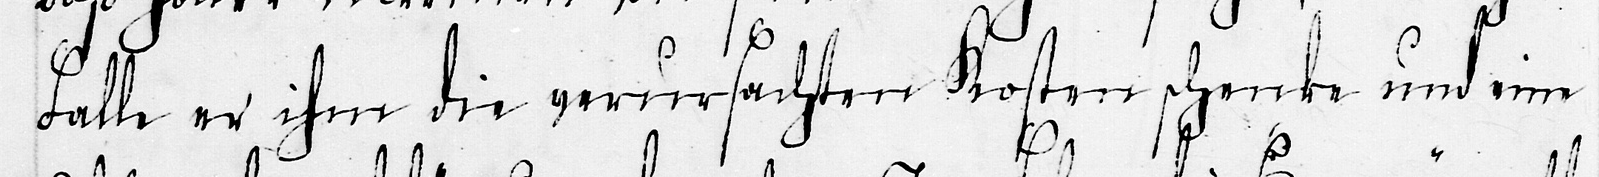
Falle er ihm die verursachten Kosten schenke und eine
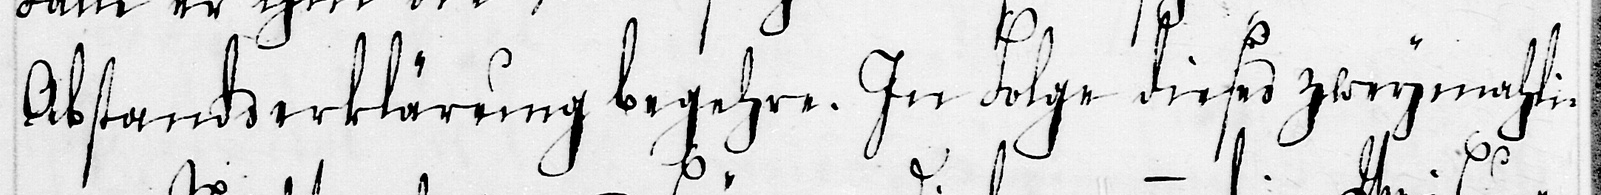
Abstandserklärung begehre. In Folge dieses zweymahli¬
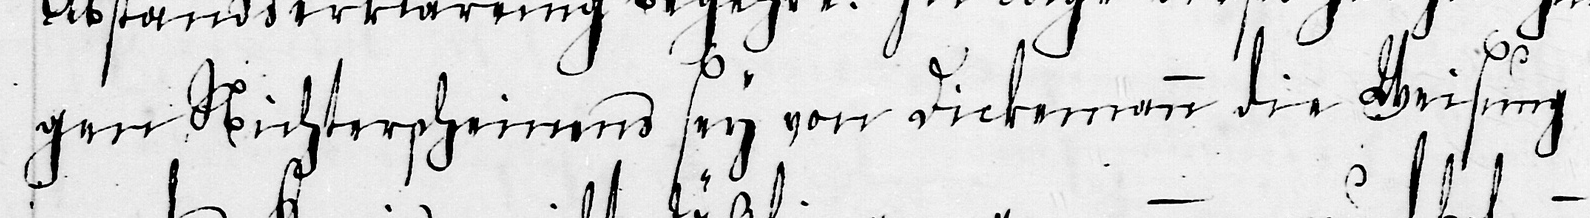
gen Nichterscheinens sey von Dickemann die Weisung
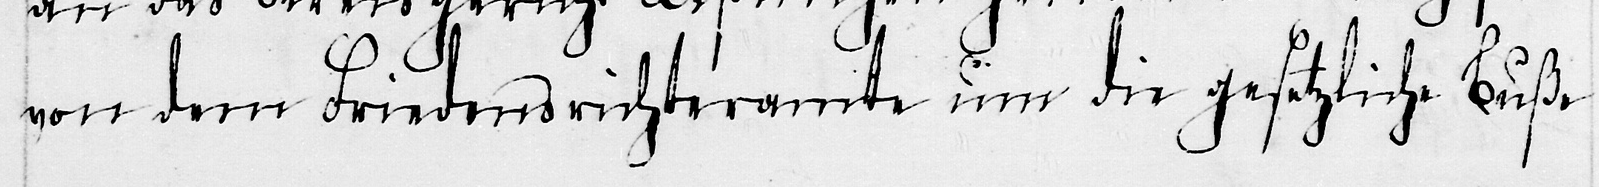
von dem Friedensrichteramte um die gesetzliche Buße
